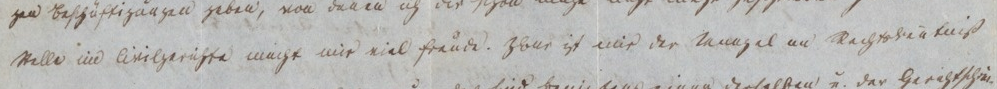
Stelle im Civilgerichte macht mir viel Freude. Zwar ist mir der Mangel an Rechtskenntniß
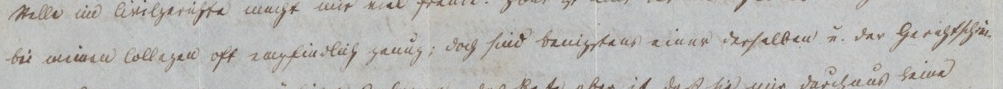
bei meinen Collegen oft empfindlich genug; doch sind wenigstens einer derselben u. der Gerichtschrei-
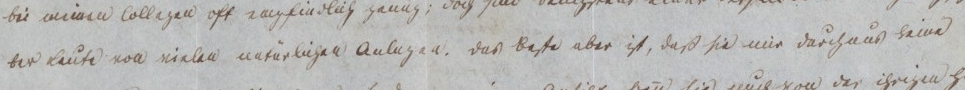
ber Leute von vielen natürlichen Anlagen. Das Beste aber ist, daß sie mir durchaus keine
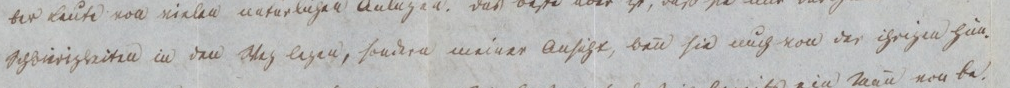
Schwierigkeiten in den Weg legen, sondern meiner Ansicht, wenn sie auch von der ihrigen him-
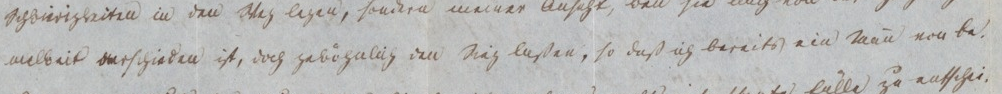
melweit verschieden ist, doch gewöhnlich den Sieg lassen, so daß ich bereits ein Mann von be-
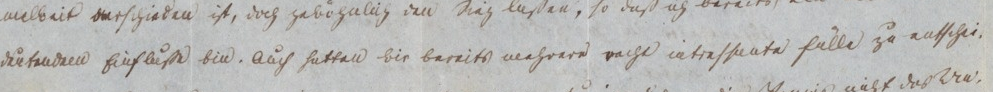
deutendem Einflusse bin. Auch hatten wir bereits mehrere recht intressante Fälle zu entschei-
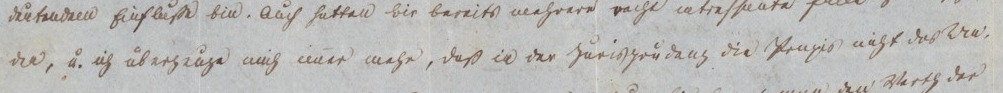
den, u. ich überzeuge mich immer mehr, daß in der Jurisprudenz die Praxis nicht das Un-
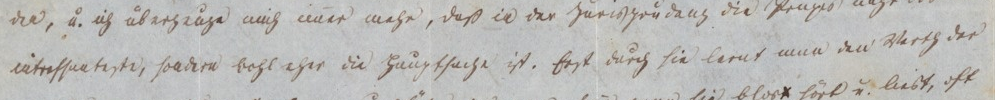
intressanteste, sondern wohl eher die Hauptsache ist. Erst durch sie lernt man den Werth der
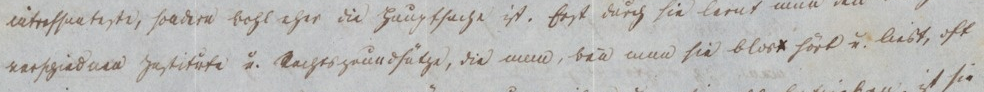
verschiednen Institute u. Rechtsgrundsätze, die man, wenn man sie blos hört u. liest, oft
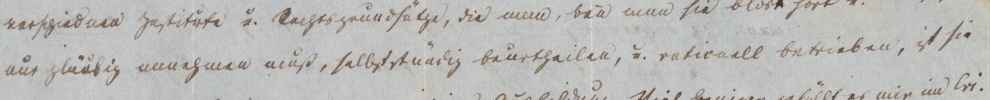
nur gläubig annehmen muß, selbständig beurtheilen, u. rationell betrieben, ist sie
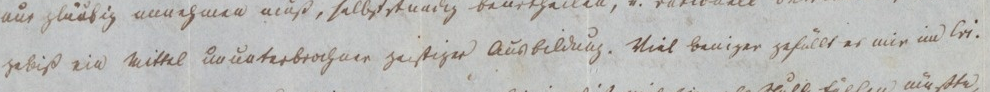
gewiß ein Mittel ununterbrochner geistiger Ausbildung. Viel weniger gefällt es mir im Cri-
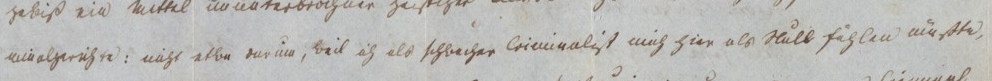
minalgerichte: nicht etwa darum, weil ich als schwacher Criminalist mich hier als Null fühlen müßte,
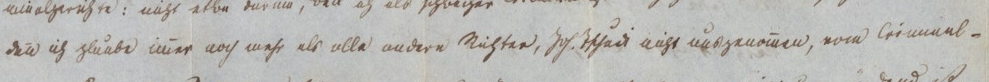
denn ich glaube immer noch mehr als alle andern Richter, Joh. Tschudi nicht ausgenommen, vom Criminal-
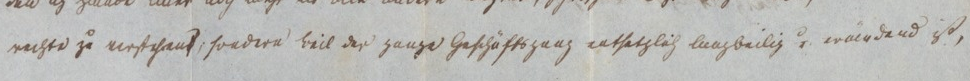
rechte zu verstehen, sondern weil der ganze Geschäftsgang entsetzlich langweilig u. ermüdend ist,
